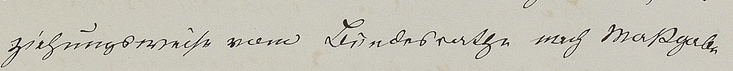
ziehungsweise vom Bundesrathe nach Maßgabe
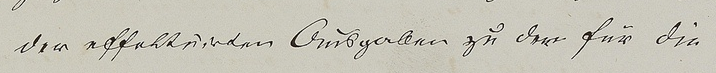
der effektuirten Ausgaben zu der für die
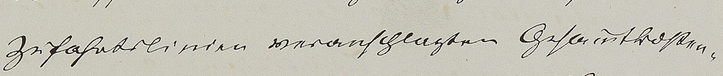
Zufahrtslinien veranschlagten Gesammtkosten-
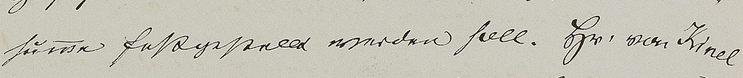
summe festgestellt werden soll. Hr. von Kinel
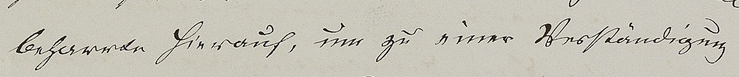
beharrte hierauf, um zu einer Verständigung
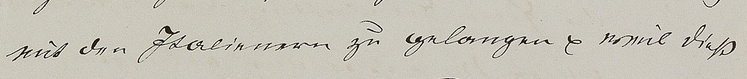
mit den Italienern zu gelangen & weil dieß
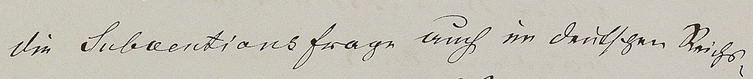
die Subventionsfrage auch im deutschen Reichs -
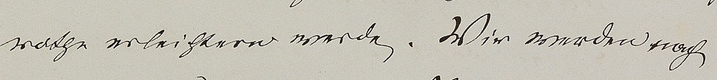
rathe erleichtern werde. Wir werden nach
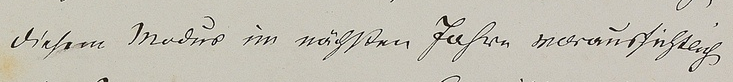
diesem Modus im nächsten Jahre voraussichtlich
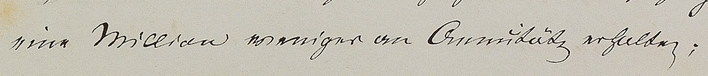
eine Million weniger an Annuitäten erhalten;
